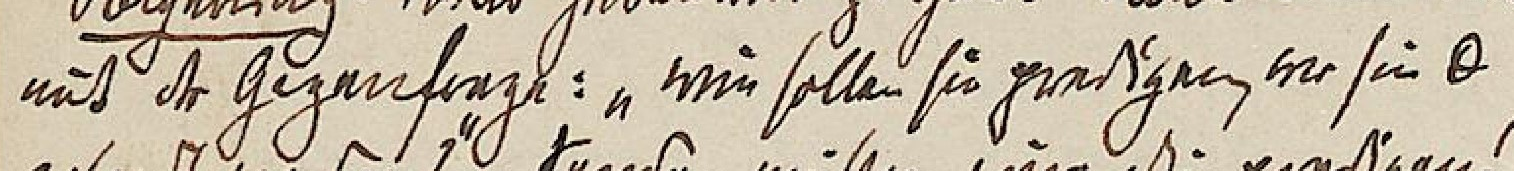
mit dr Gegenfrage: "wie sollen sie predigen, wo sie o
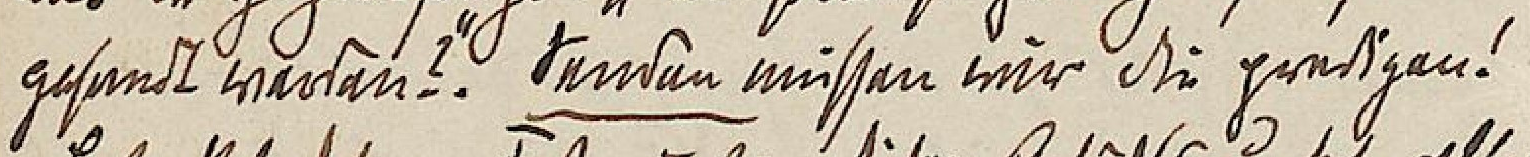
gesandt werden?" Senden müssen wir die predigen!
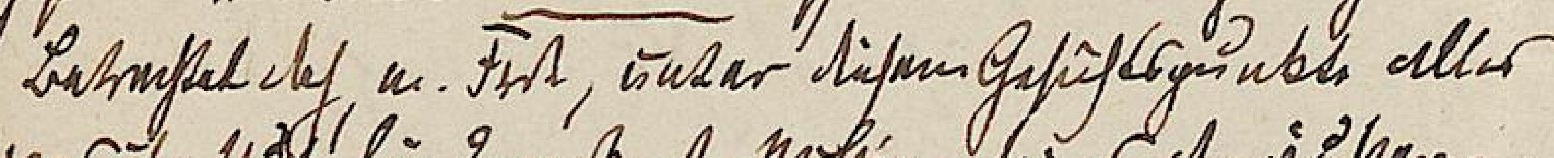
Betrachtet doch, m. Frde, unter diesem Gesichtspunkte alles
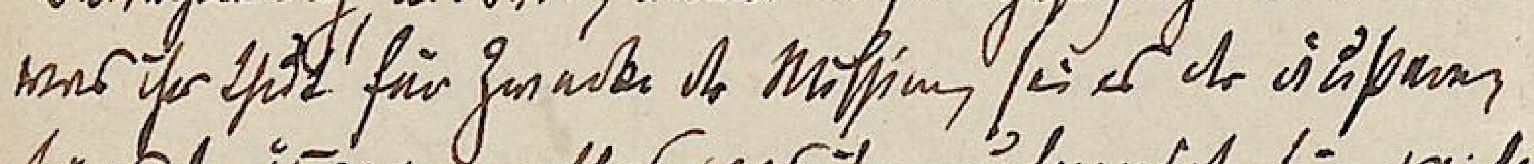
was ihr thut für Zwecke der Mission, sei es dr äußeren,
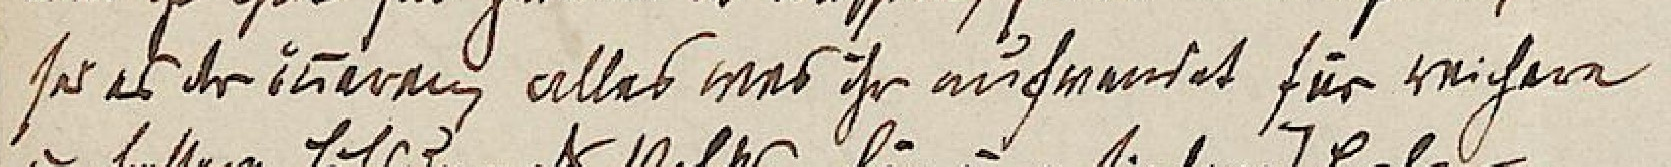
sei es der inneren, alles was ihr aufwendet für reichere
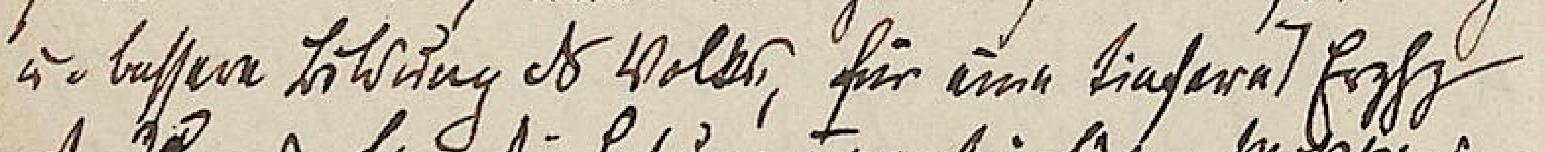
u. bessere Bildung des Volks, für eine tiefere Erzhg
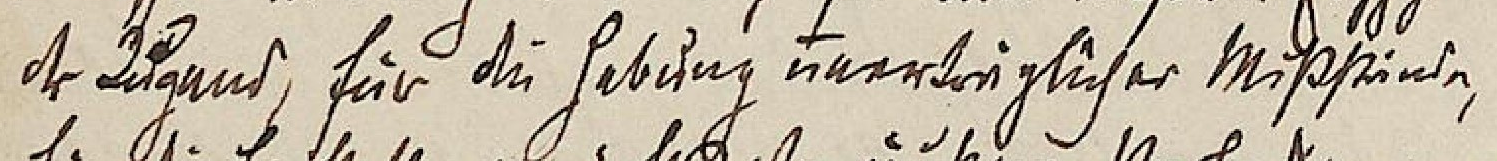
der Jugend, für die Hebung unerträglicher Mißstände,
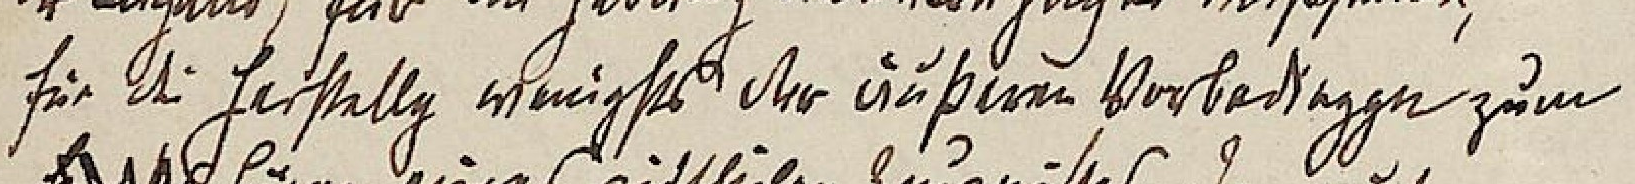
für die Herstellg wenigsts der äußeren Vorbedinggn zum
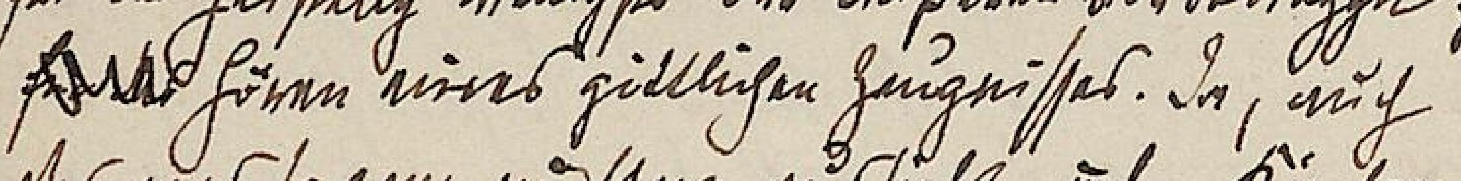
fr des Hören eines göttlichen Zeugnisses. Ja, auch
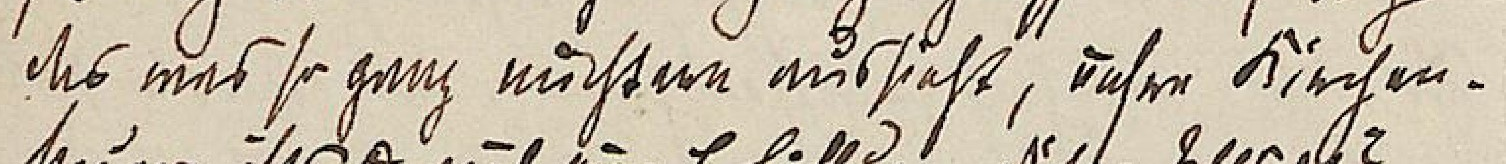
das was so ganz nüchtern aussieht, unsre Kirchen¬
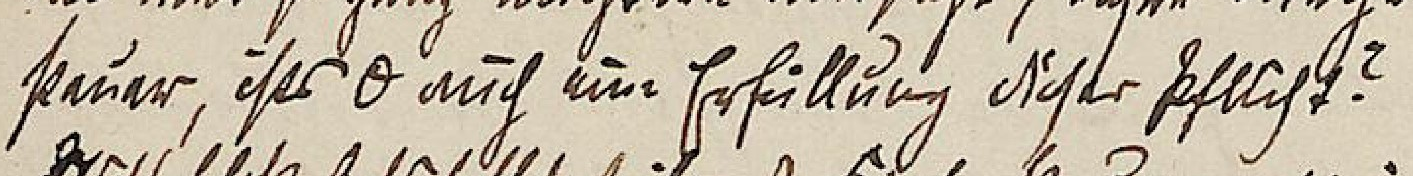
steuer, ists o auch eine Erfüllung dieser Pflicht?
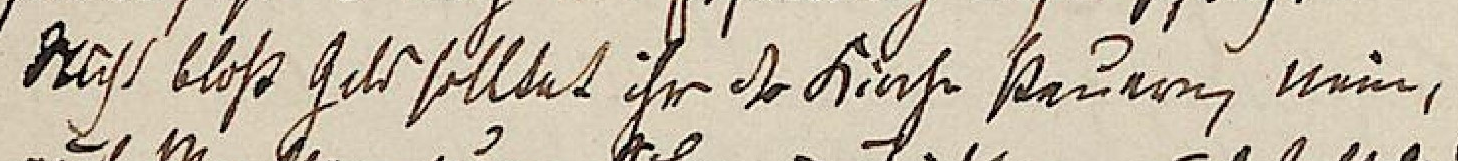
Nicht bloß Geld solltet ihr der Kirche steuern, nein,
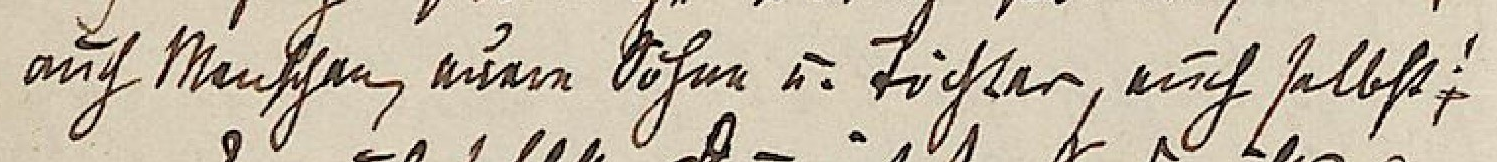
auch Menschen, euere Söhne u. Töchter, euch selbst!
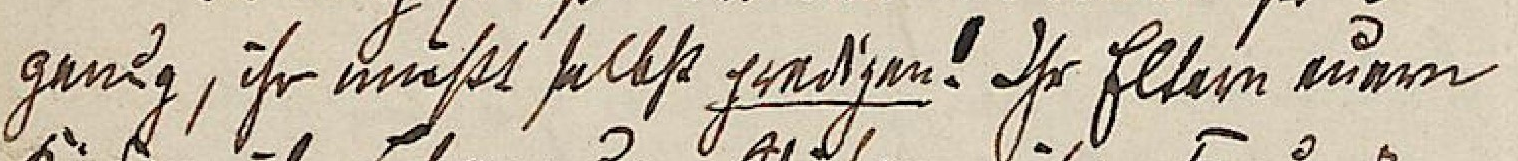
genug, ihr müßt selbst predigen? Ihr Eltern euren
